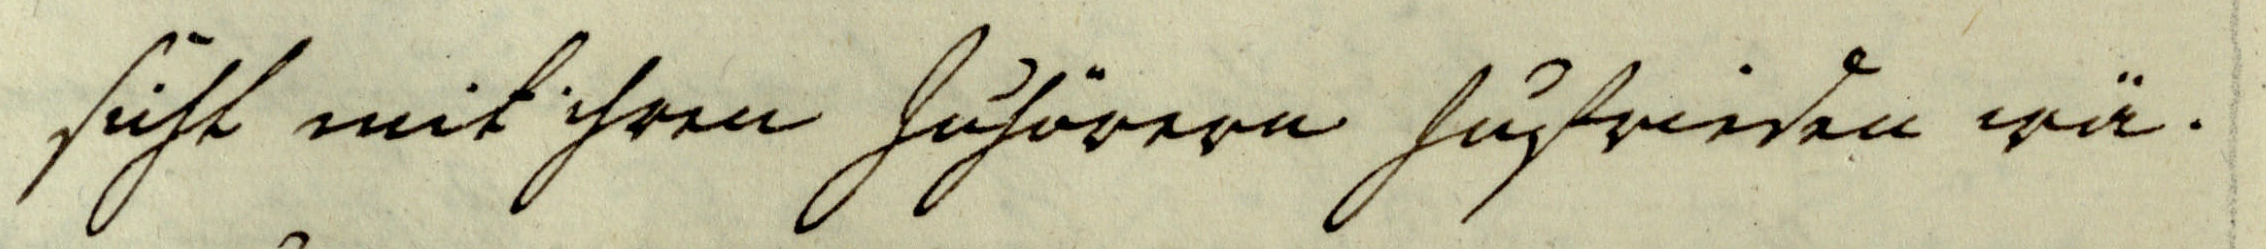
sich mit ihren Zuhörern zufrieden wä¬
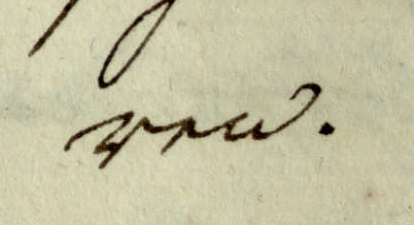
ren.
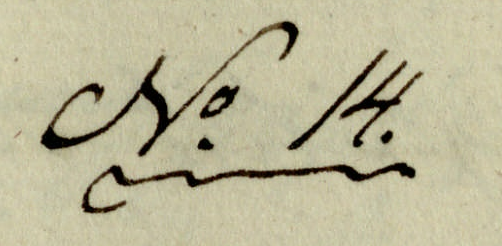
No 14.
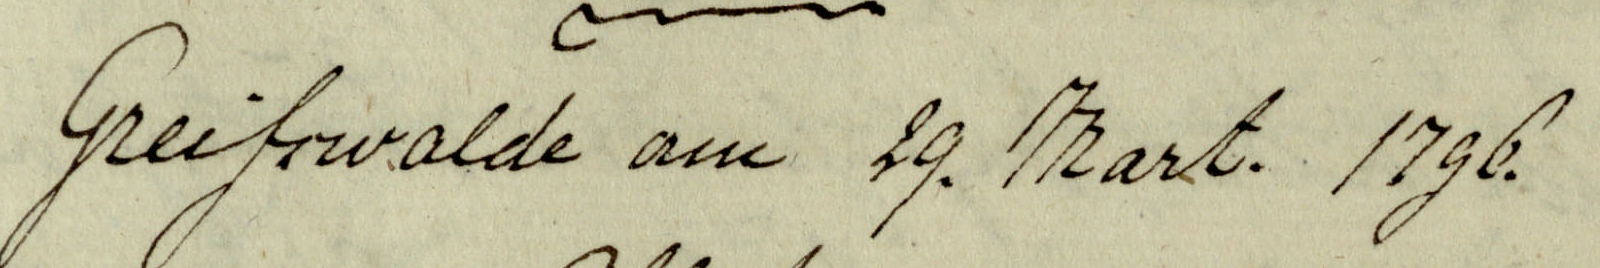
Greifswalde am 29. Mart. 1796.
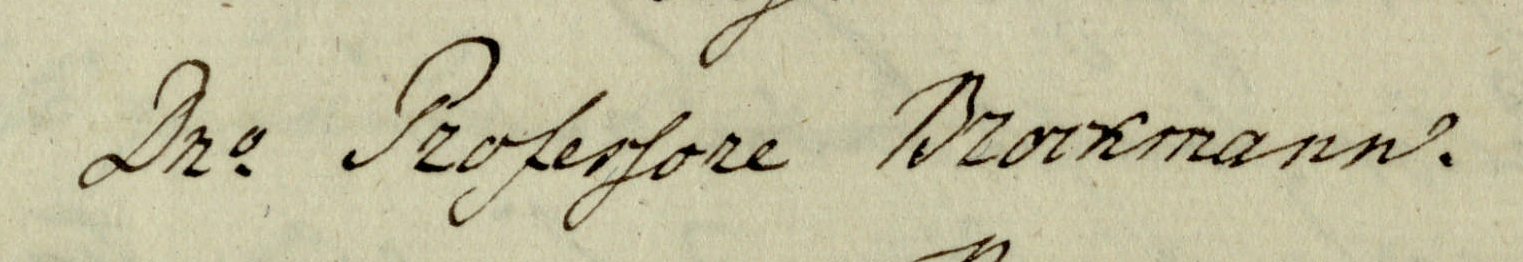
Dno Professore Brockmann.
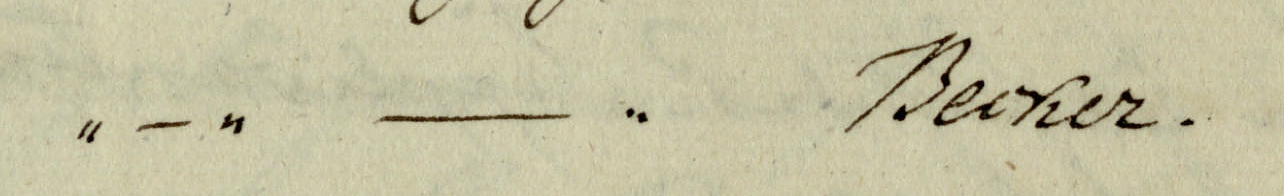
Becker.
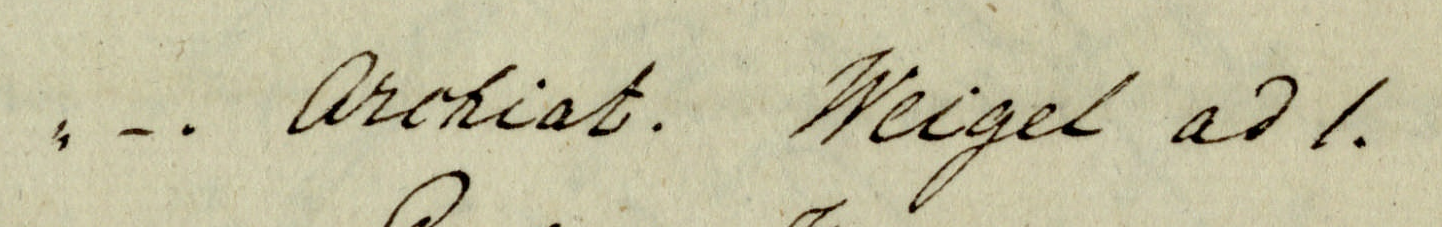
Archiat. Weigel ad 1.
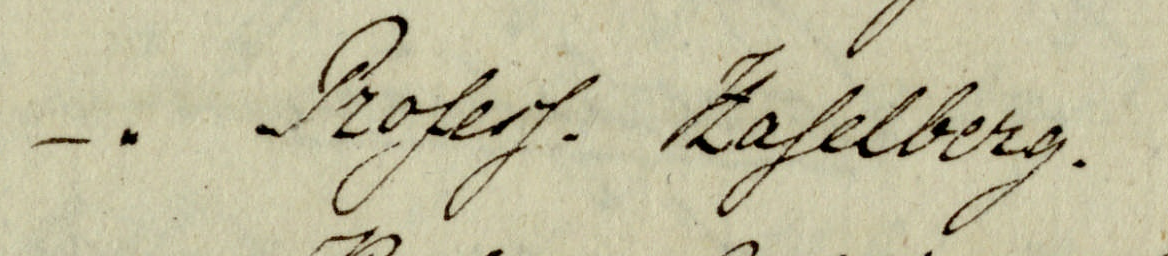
Profess. Haselberg.
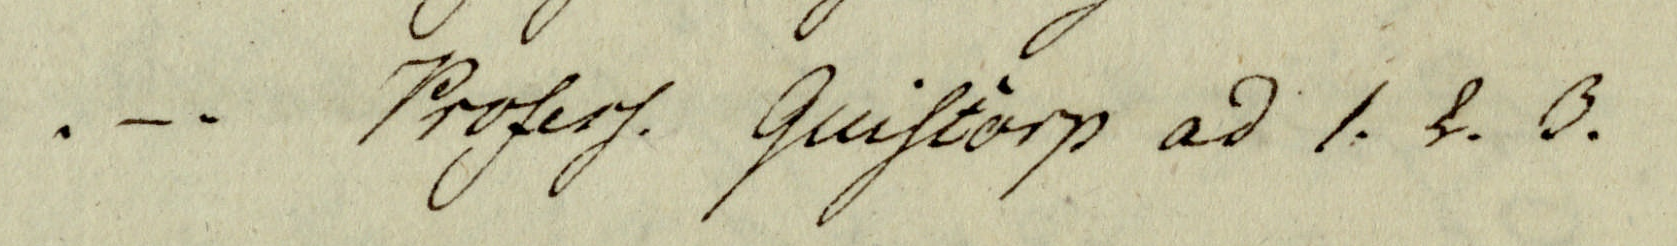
Profess. Quistorp ad 1. 2. 3.
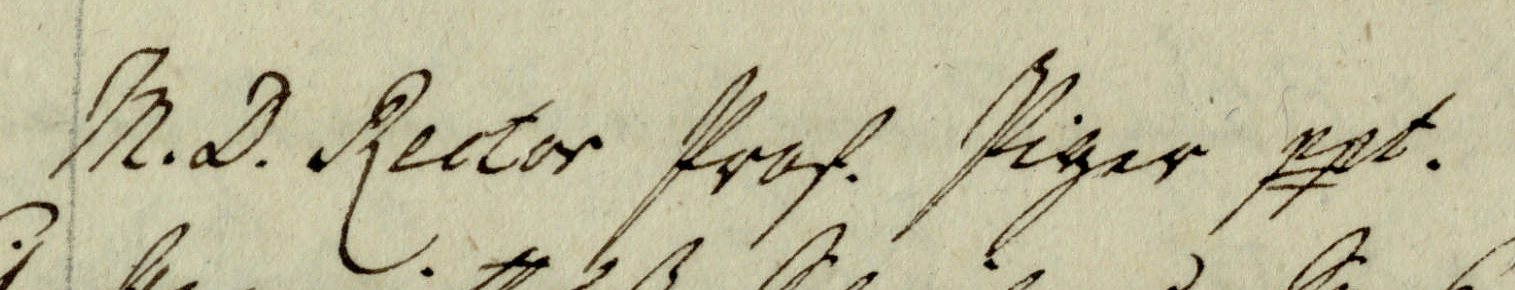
M. D. Rector Prof. Piper ppt.
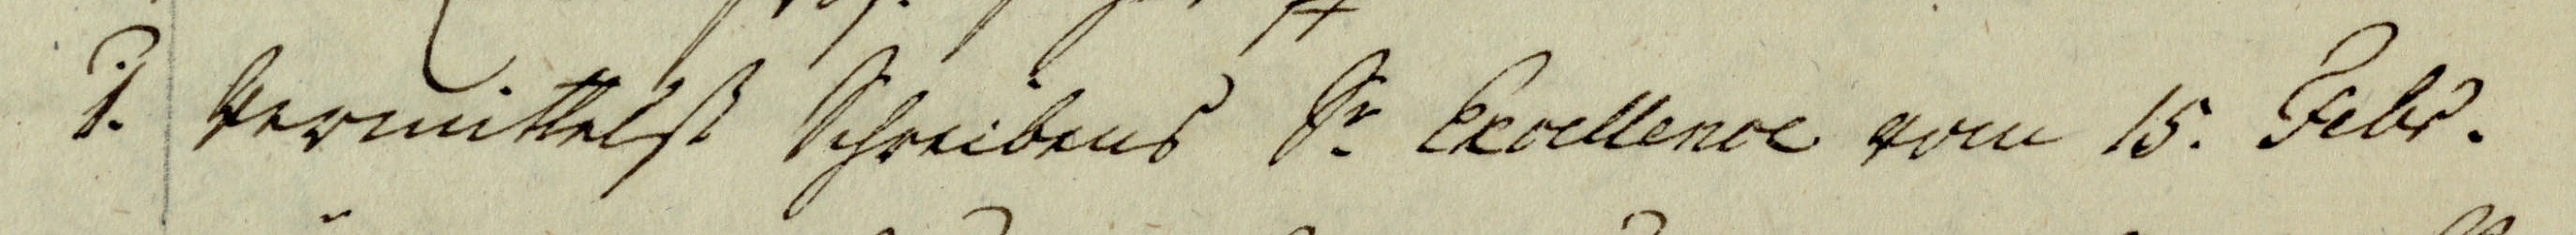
1. Vermittelst Schreibens Sr Excellence vom 15. Febr.
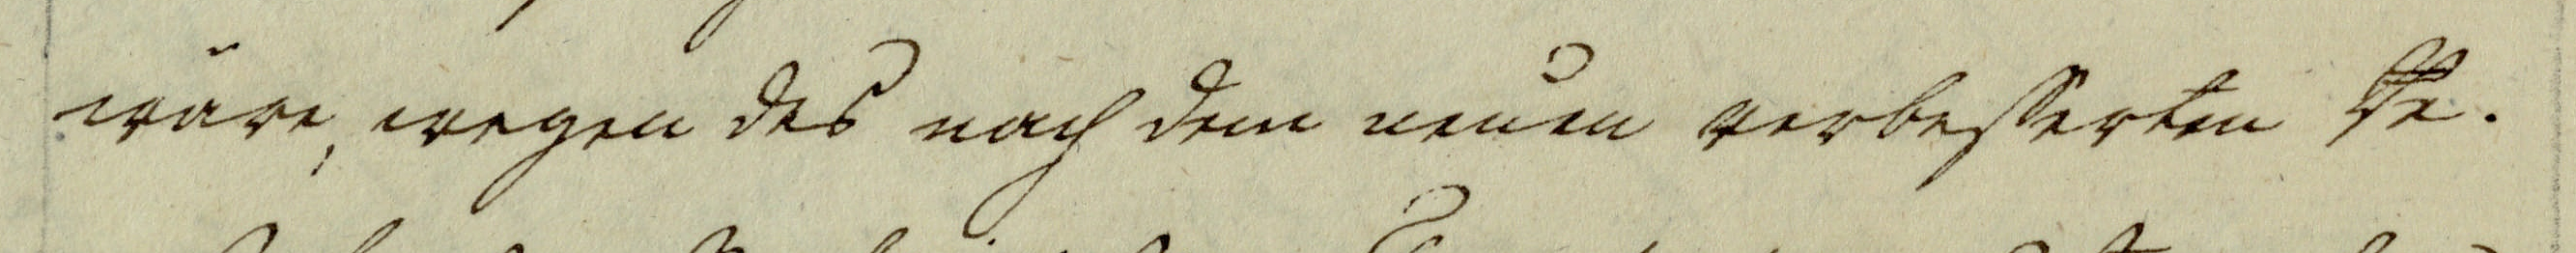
wäre, wegen des nach dem neuen verbesserten Re¬
